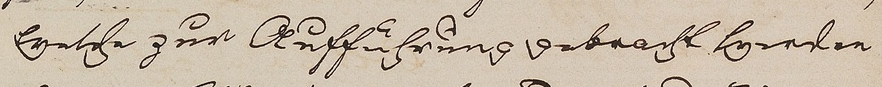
welche zur Aufführung gebracht werden
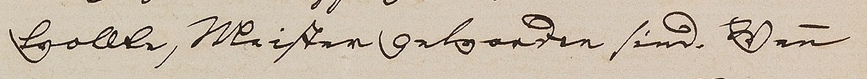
wollte, Meister geworden sind. Wenn
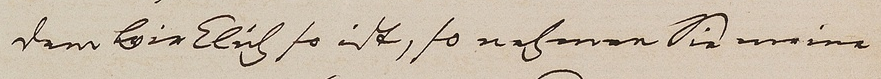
dem wirklich so ist, so nehmen Sie meine
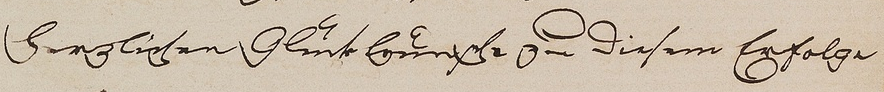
herzlichen Glückwünsche zu diesem Erfolge
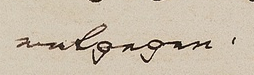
entgegen.
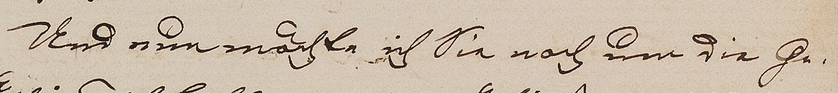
Und nun möchte ich Sie noch um die Ge-
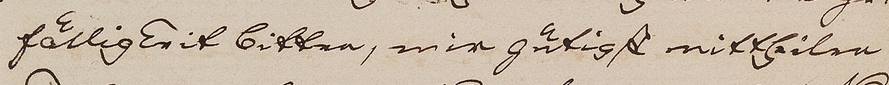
fälligkeit bitten, mir gütigst mittheilen
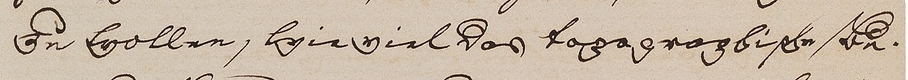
zu wollen, wie viel das topographische Bu-
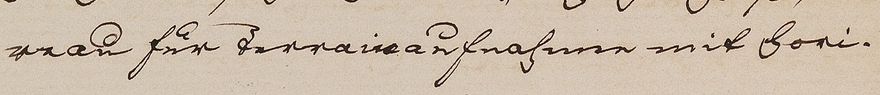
reau für Terrainaufnahmen mit Hori-
